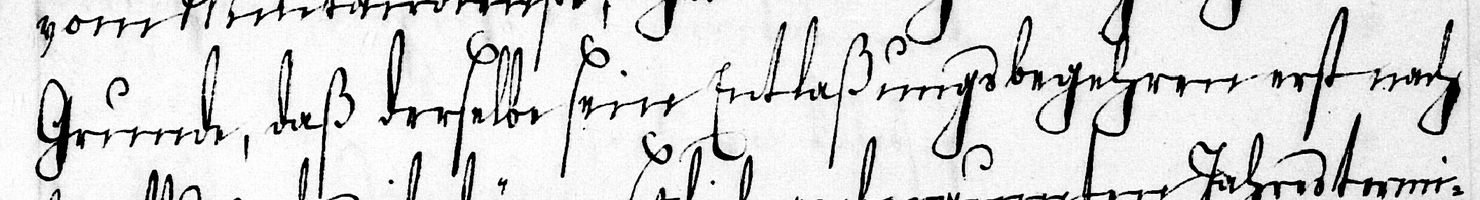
Grunde, daß derselbe sein Entlaßungsbegehren erst nach
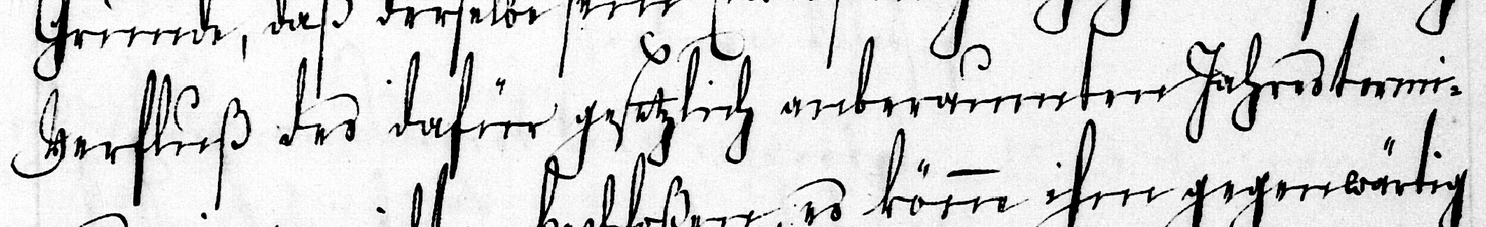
Verfluß des dafür gesetzlich anberaumten Jahrestermi¬
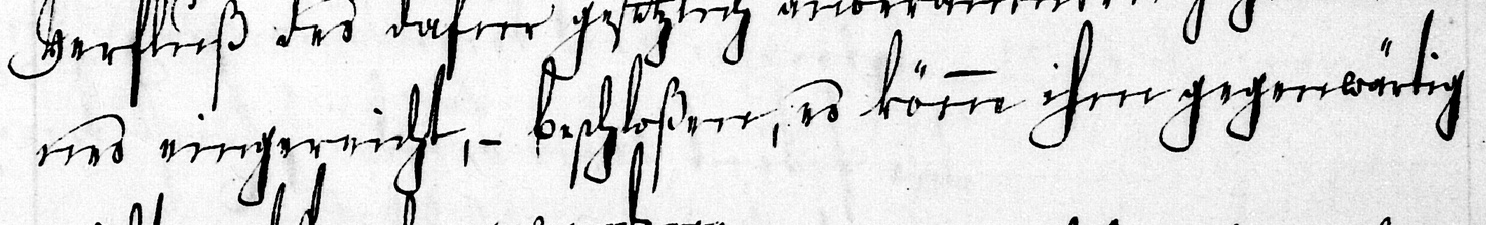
nes eingereicht, – beschloßen, es könne ihm gegenwärtig
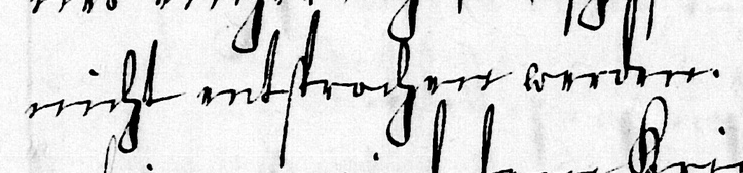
nicht entsprochen werden.
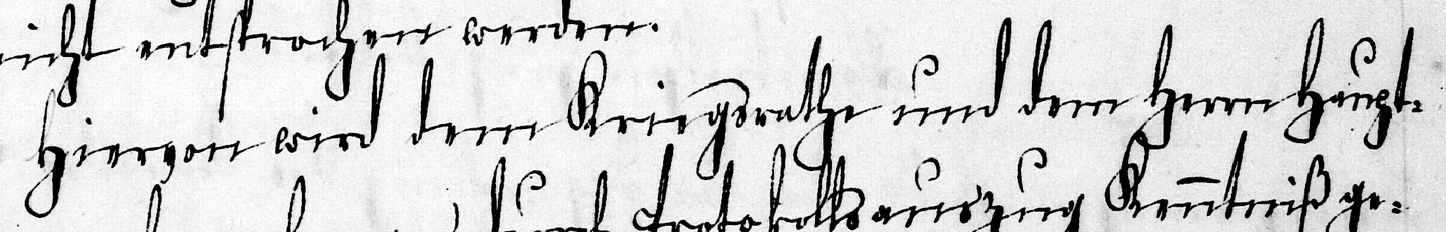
Hiervon wird dem Kriegsrathe und dem Herrn Haupt¬
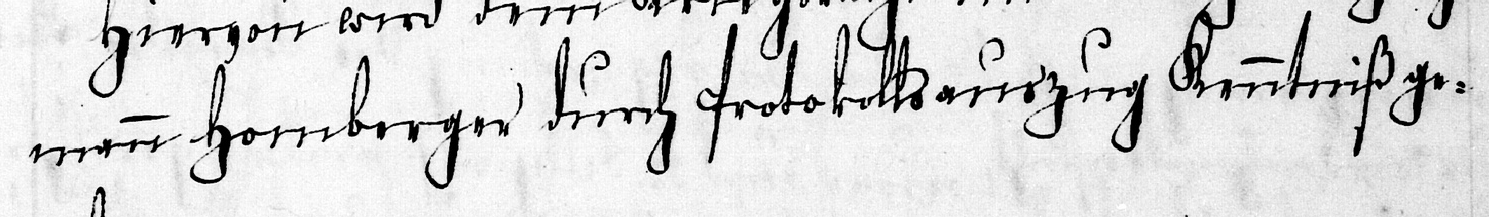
mann Homberger durch Protokollsauszug Kenntniß ge¬
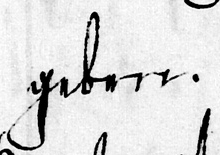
geben.
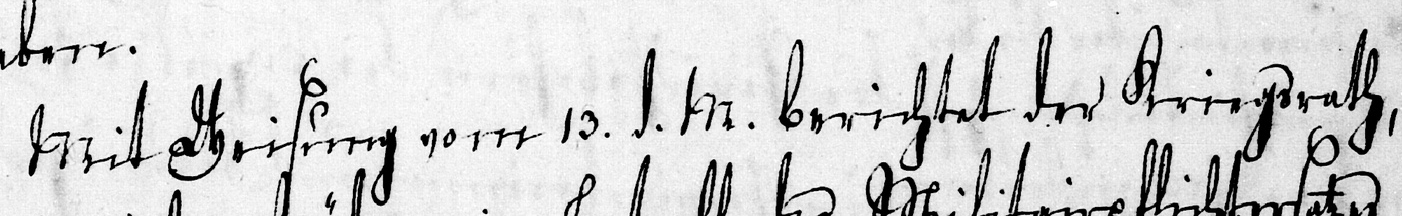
Mit Weisung vom 13. d. M. berichtet der Kriegsrath,
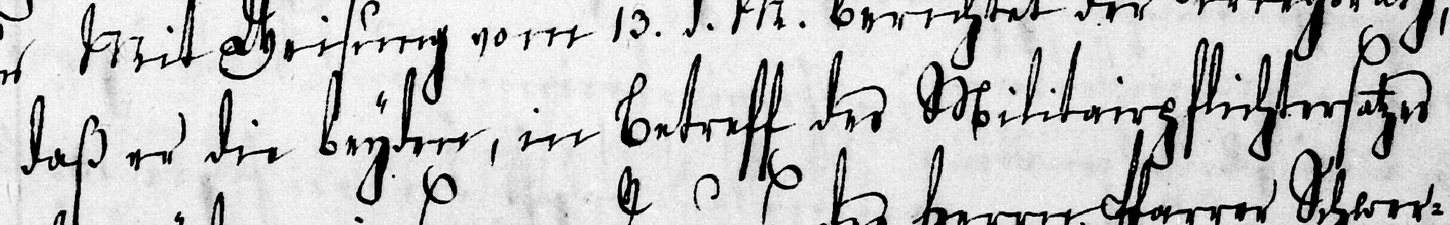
daß er die beyden, in Betreff des Militairpflichtersatz¬
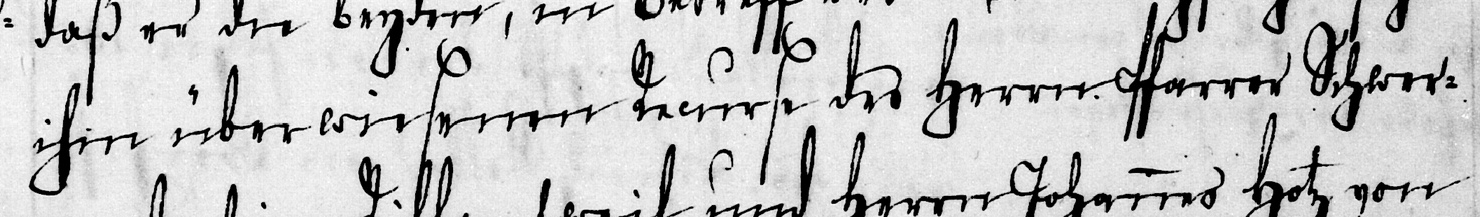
ihm überwiesenen Recurse des Herrn Pfarrer Schwer¬
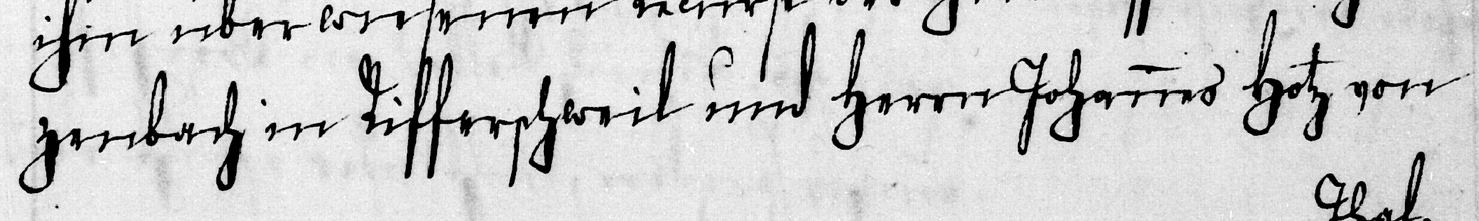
zenbach in Rifferschweil und Herrn Johannes Hotz von
